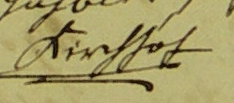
Kirchhof
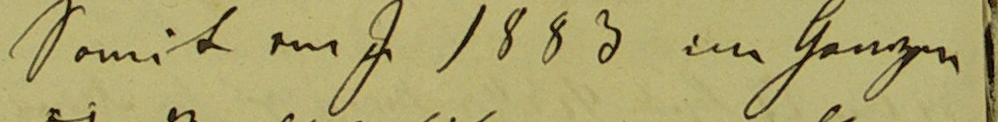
Somit im Jahre 1883 im Ganzen
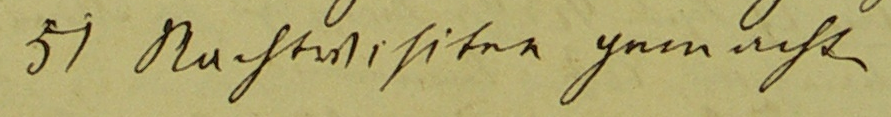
51 Nachtvisiten gemacht.
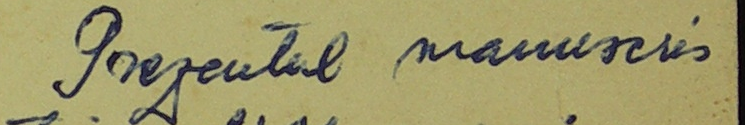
Notiz des Stadt-Archivs: Aus dem Rumänischen:
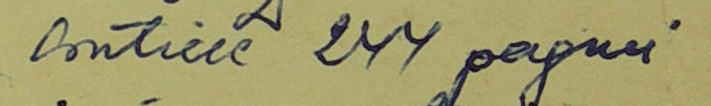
„Vorliegendes Manuskript enthält 244 Seiten
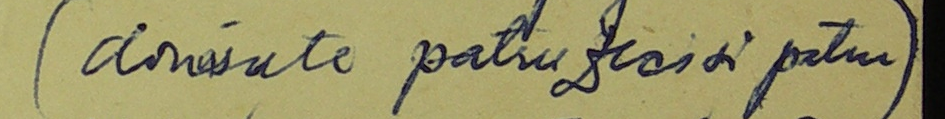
( zweihundert vier und vierzig )
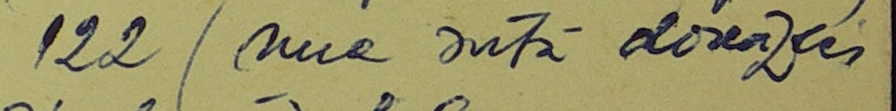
122 Mikrofilme.
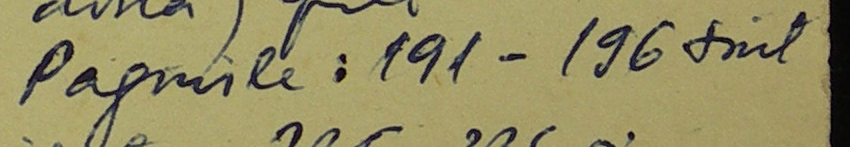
Die Seiten 191-196 sind
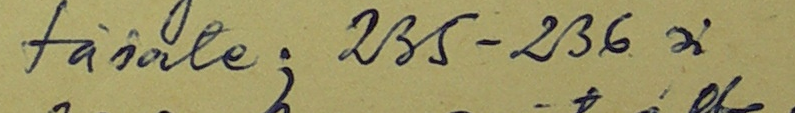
herausgerissen; 235-236 und
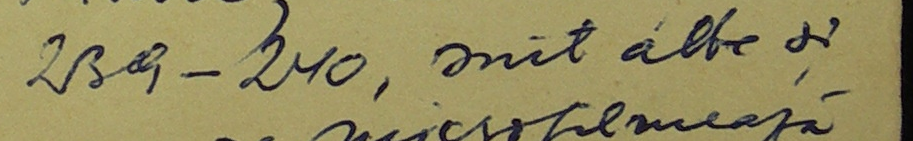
239-240 sind weiß
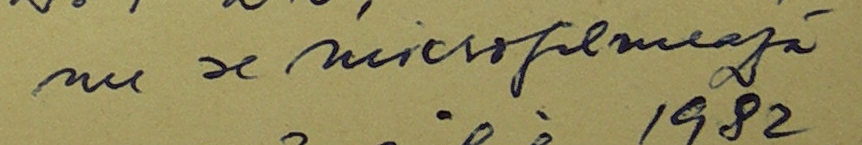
und nicht mikrogefilmt.
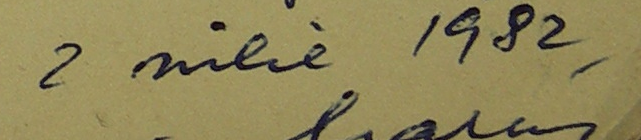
2 Juli 1982.
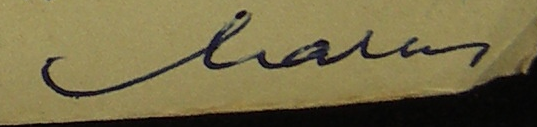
Gez: unleserlich (Marius ?)
